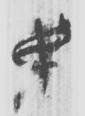民
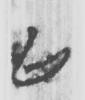㠯（以）
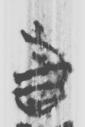{屮日}
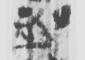血
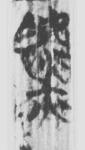{既火}
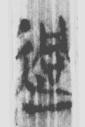迵
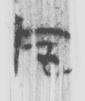厇
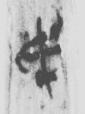民
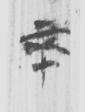不
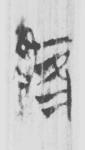{疒次}
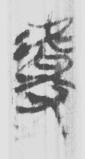{虍且又}
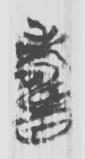壽
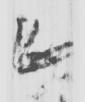亡
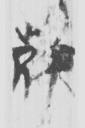殀
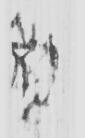死
